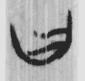曰
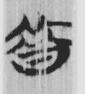昔
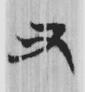又
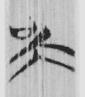吳
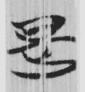是
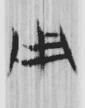用
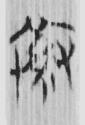索
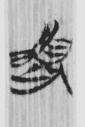{日止頁}
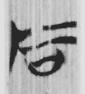后
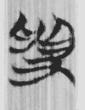受
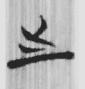之
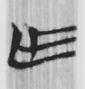乍
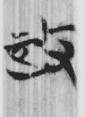政
